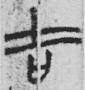吉
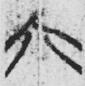六
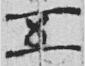五
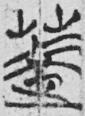○（來）
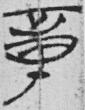章
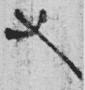又（有）
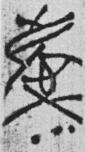慶
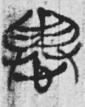○（譽）
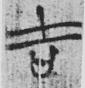吉
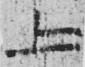上
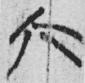六
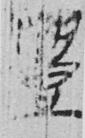豐
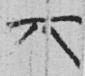亓（其）
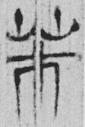芾（屋）
